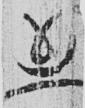至
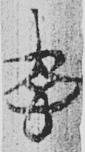○（愛）
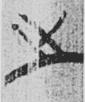之
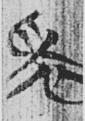○（卒）
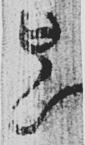也
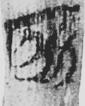所
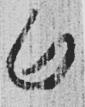㠯（以）
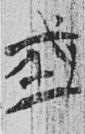城（成）
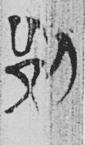死
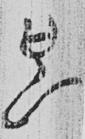也
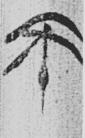不
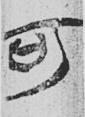可
